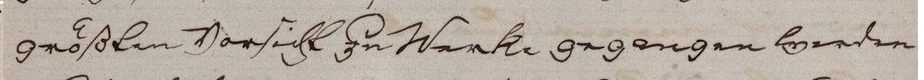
größten Vorsicht zu Werke gegangen werden
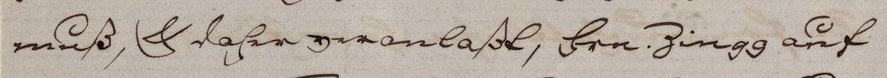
muß, & daher veranlaßt, Hrn. Zingg auf
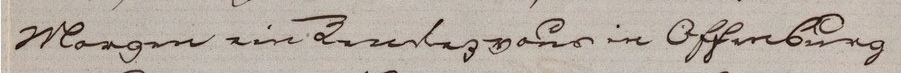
Morgen ein Rendez vous in Offenburg
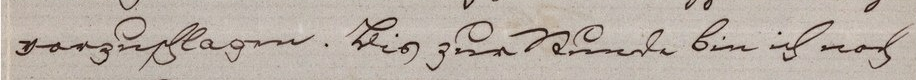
vorzuschlagen. Bis zur Stunde bin ich noch
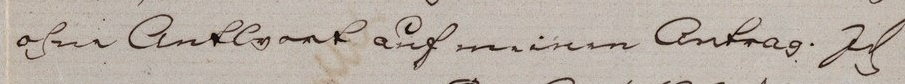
ohne Antwort auf meinen Antrag. Ich
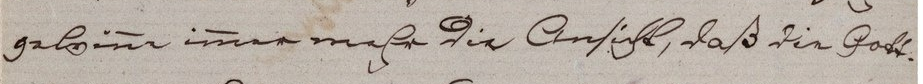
gewinne immer mehr die Ansicht, daß die Gott-
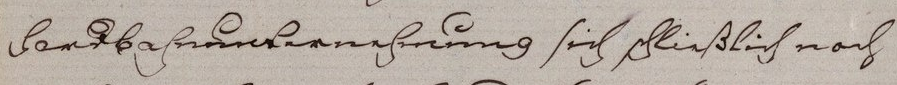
hardbahnunternehmung sich schließlich noch
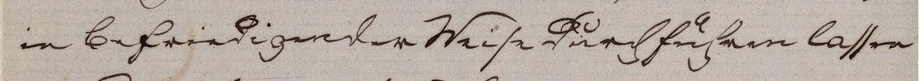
in befriedigender Weise durchführen lassen
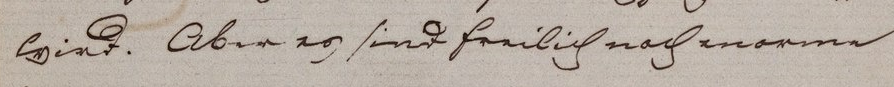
wird. Aber es sind freilich noch enorme
